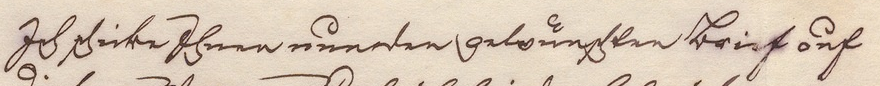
Ich schicke Ihnen nun den gewünschten Brief auf
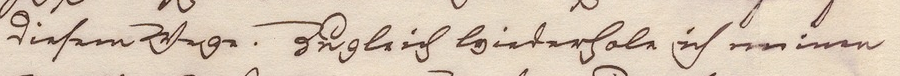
diesem Wege. Zugleich wiederhole ich meinen
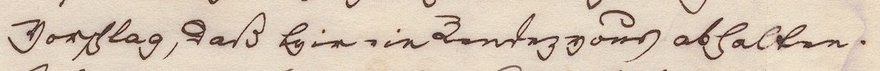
Vorschlag, daß wir ein Rendezvous abhalten.
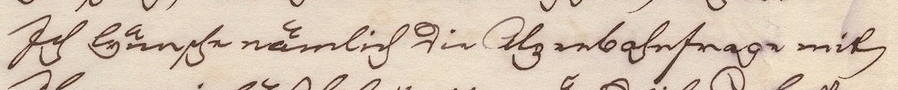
Ich wünsche nämlich die Alpenbahnfrage mit
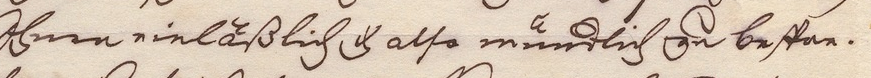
Ihnen einläßlich & also mündlich zu bespre-
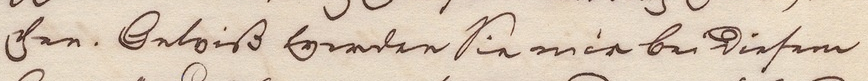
chen. Gewiß werden Sie mir bei diesem
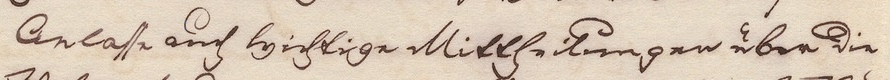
Anlasse auch wichtige Mittheilungen über die
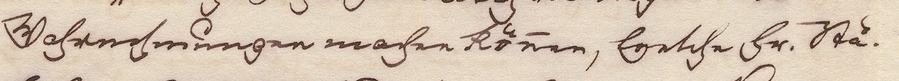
Wahrnehmungen machen können, welche Hr. Stä-
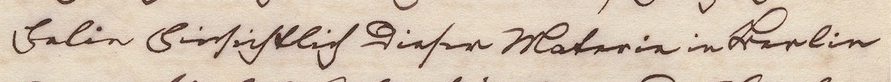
helin hinsichtlich dieser Materie in Berlin
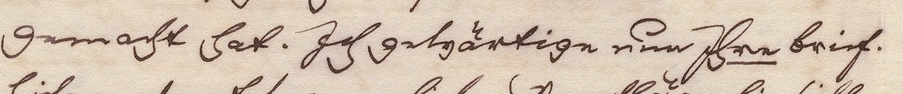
gemacht hat. Ich gewärtige nun Ihre brief-
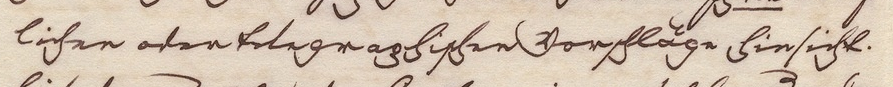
lichen oder telegraphischen Vorschläge hinsicht-
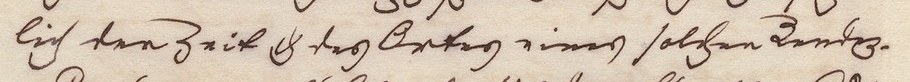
lich der Zeit & des Ortes eines solchen Rendez-
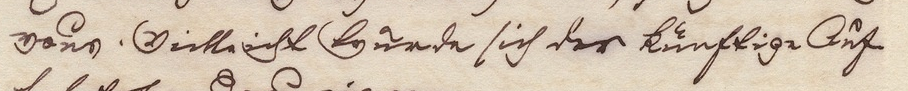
vous. Vielleicht würde sich der künftige Auf-
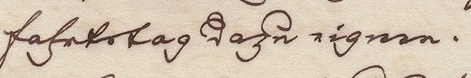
fahrtstag dazu eignen.
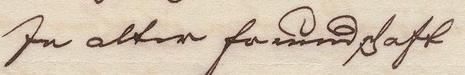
In aller Freundschaft
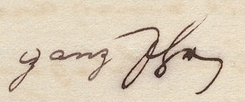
ganz Ihr
